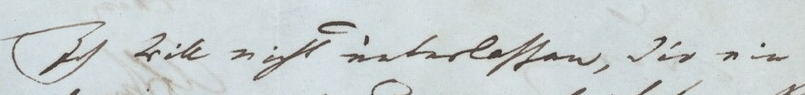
Ich will nicht unterlassen, dir ein
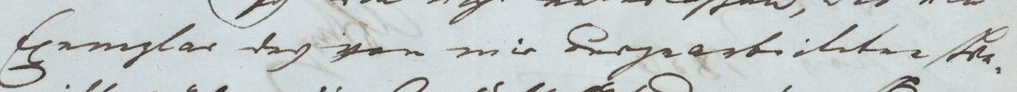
Exemplar des von mir ausgearbeiteten Be-
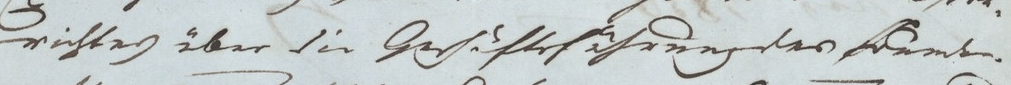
richtes über die Geschäftsführung des Bundes-
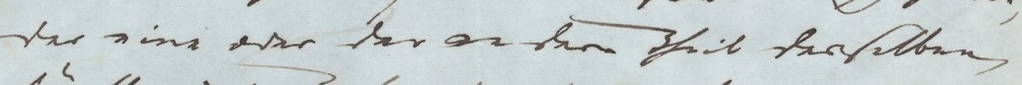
der eine oder der andere Theil desselben
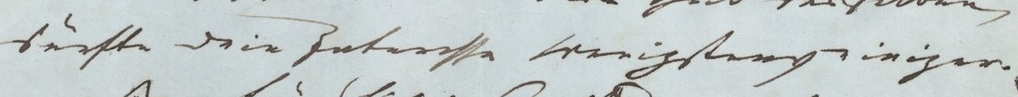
dürfte dein Interesse wenigstens einiger-
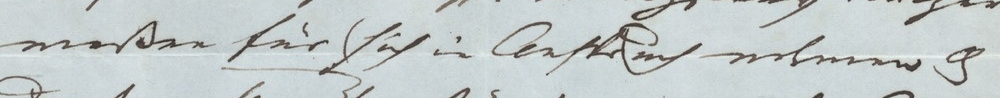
maßen für sich in Anspruch nehmen &
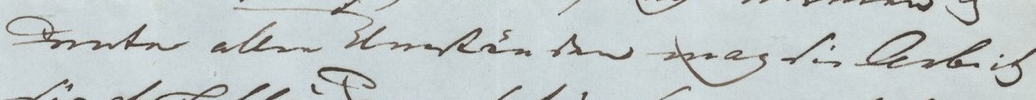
unter allen Umständen mag die Arbeit
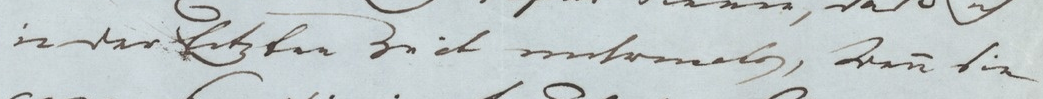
in der letzten Zeit mehrmals, wenn die
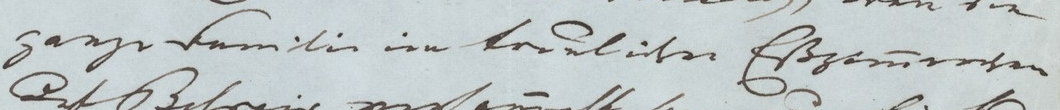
ganze Familie im treulichen Eßzimmerchen
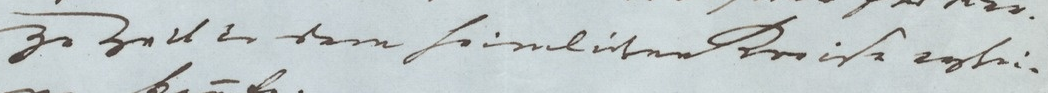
ze Zeit in dem heimlichen Kreise erschei-
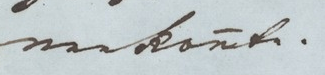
nen konnte.
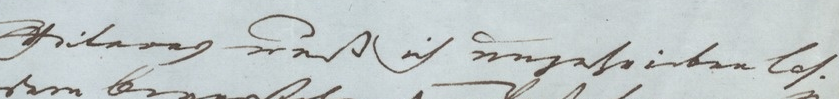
Weiteres muß ich ungeschrieben las-
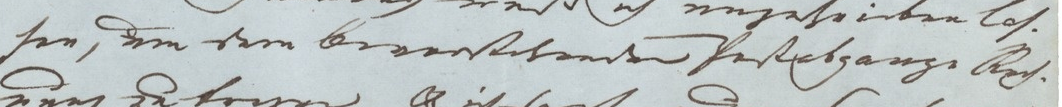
sen, um dem bevorstehenden Postabgange Rech-
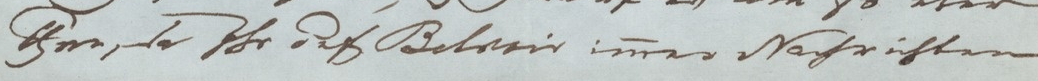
thun, da Ihr auf Belvoir immer Nachrichten
